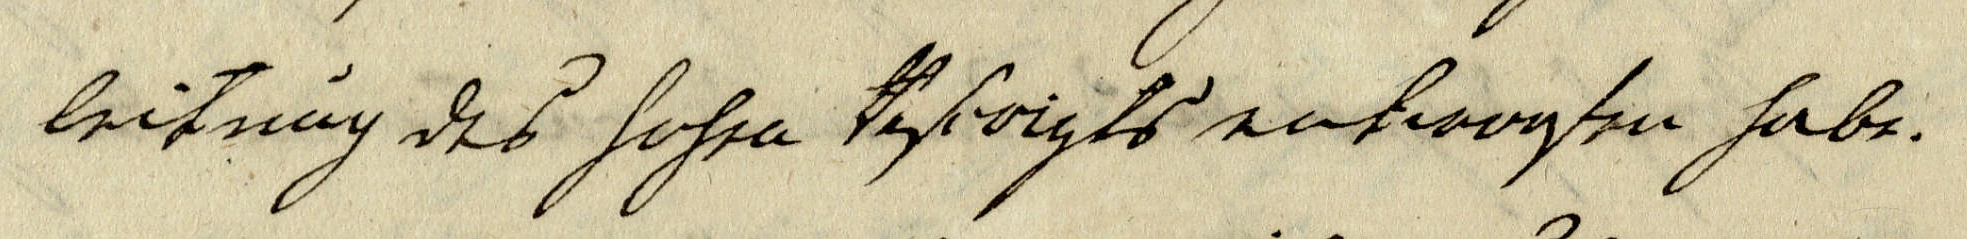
leitung des hohen Rescripts entworfen habe.
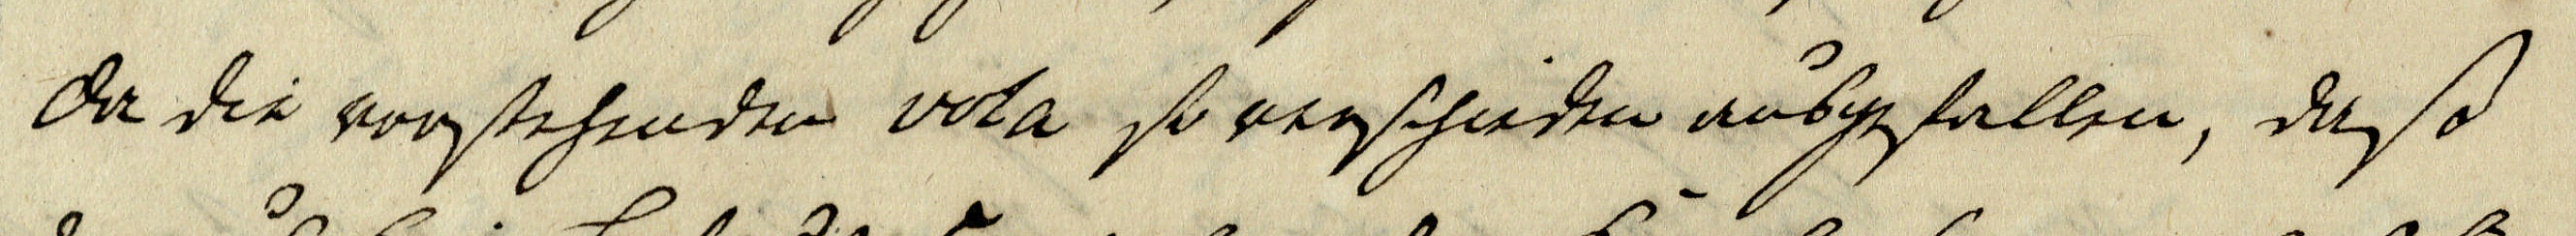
Da die vorstehenden vota so verschieden ausgefallen, daß
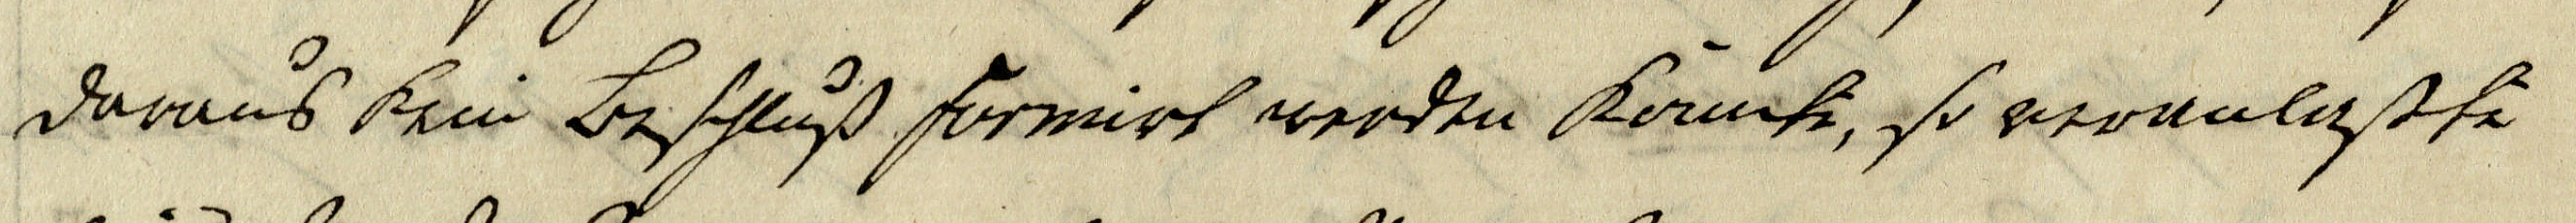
daraus kein Beschluß formirt werden könnte, so veranlaßte
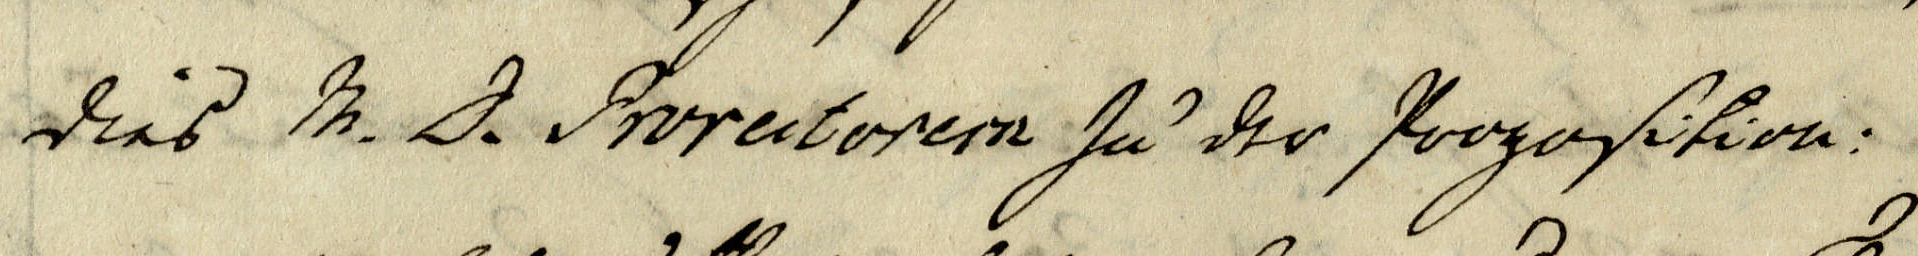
dies M. D. Prorectorem zu der Proposition:
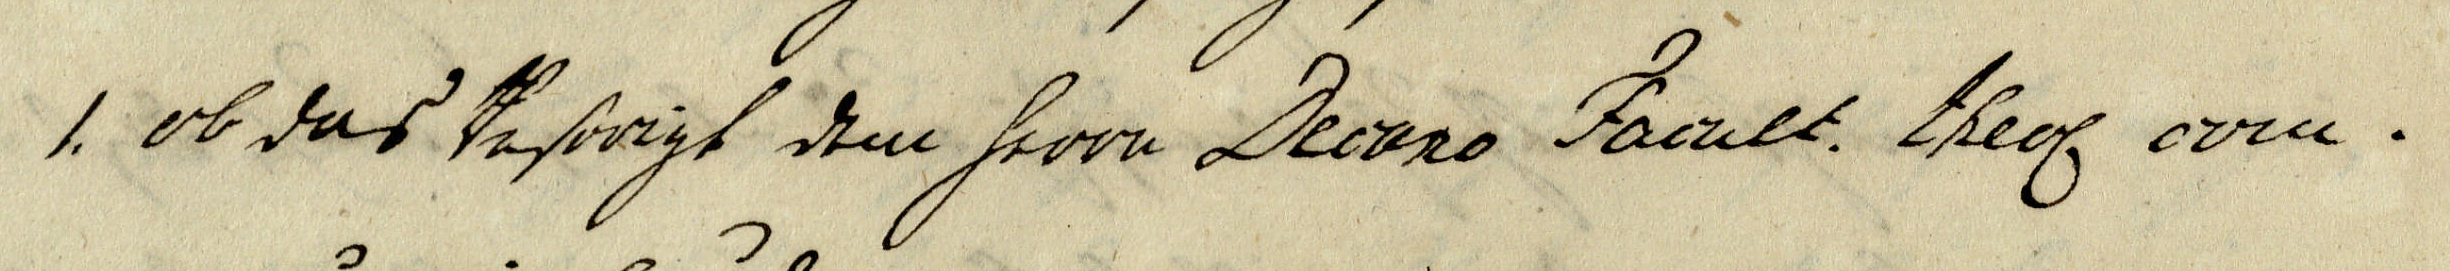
1. ob das Rescript dem Herrn Decano Facult. Theol. com¬
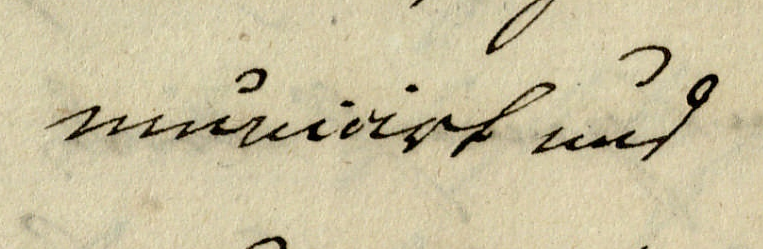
municirt und
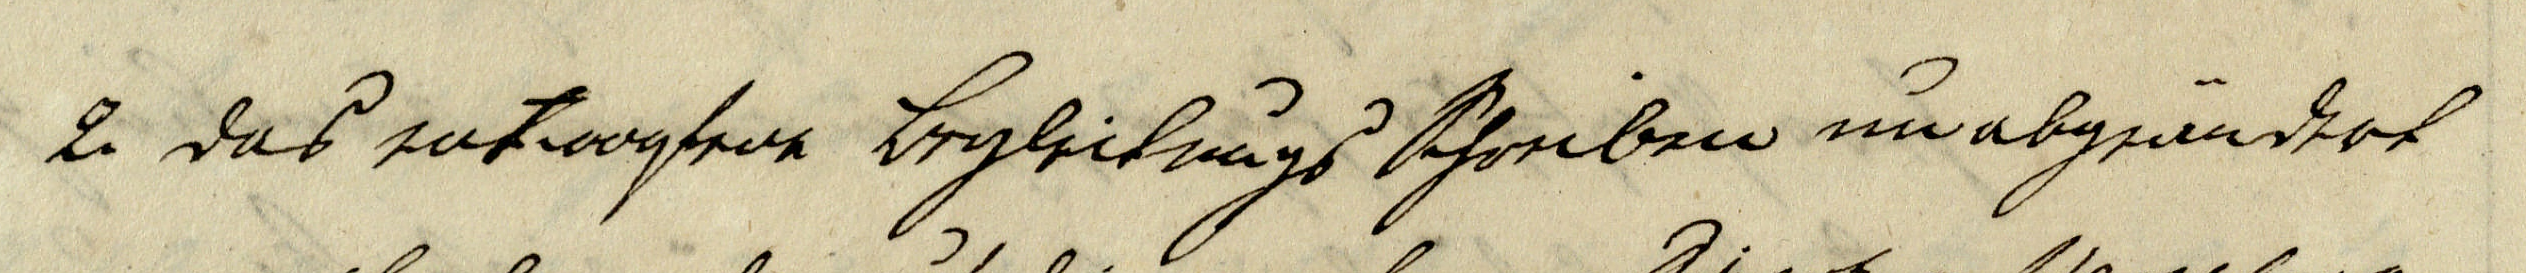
2. das entworfene Begleitungs Schreiben unabgeändert
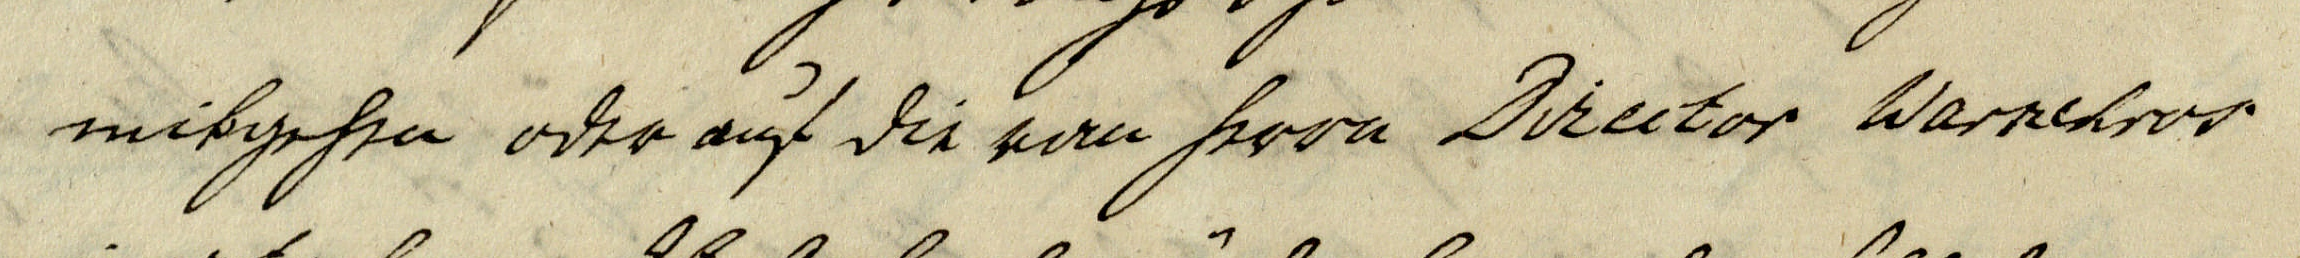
mitgehen oder auf die vom Herrn Director Warnekros
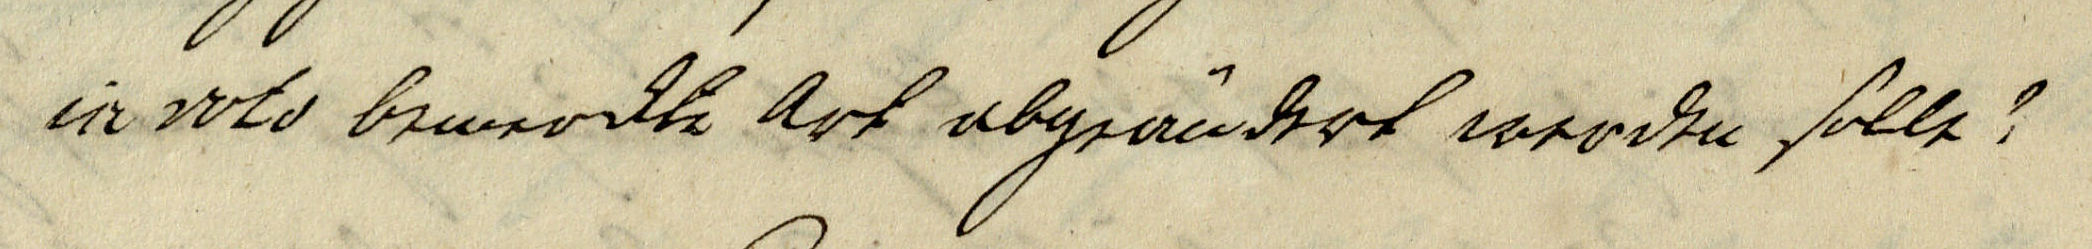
in voto bemerckte Art abgeändert werden solle?
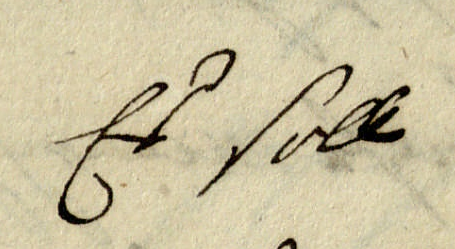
Es soll
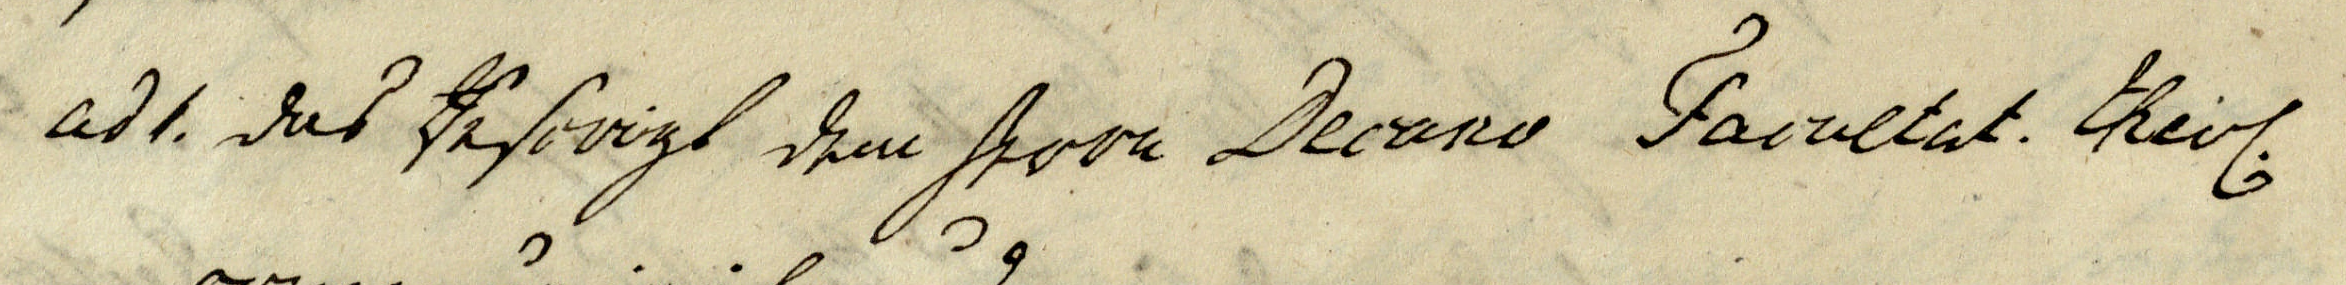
ad 1. das Rescript dem Herrn Decano Facultat. theol.
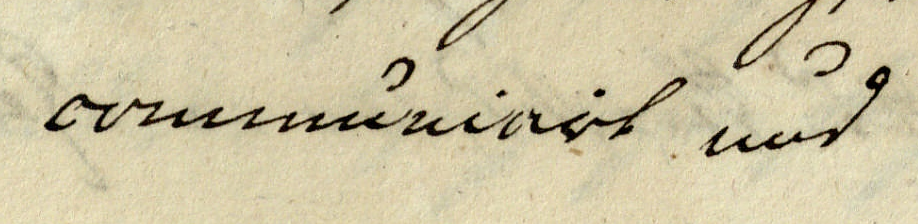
communicirt und
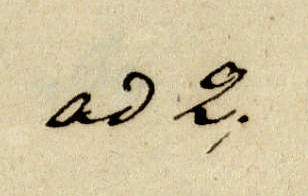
ad 2.
